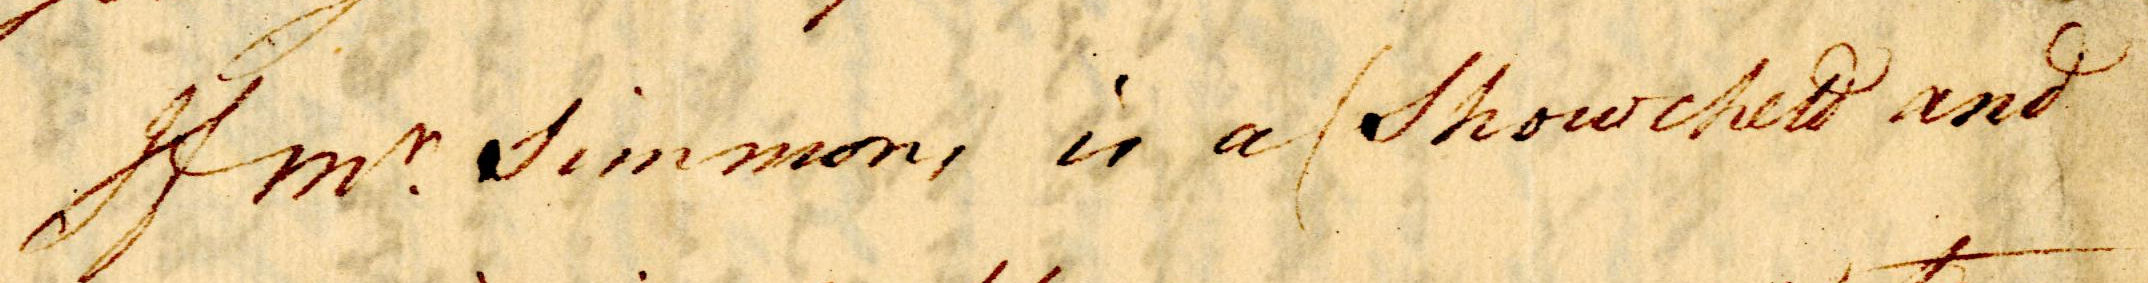If M^r Simons is a (Showcheld and
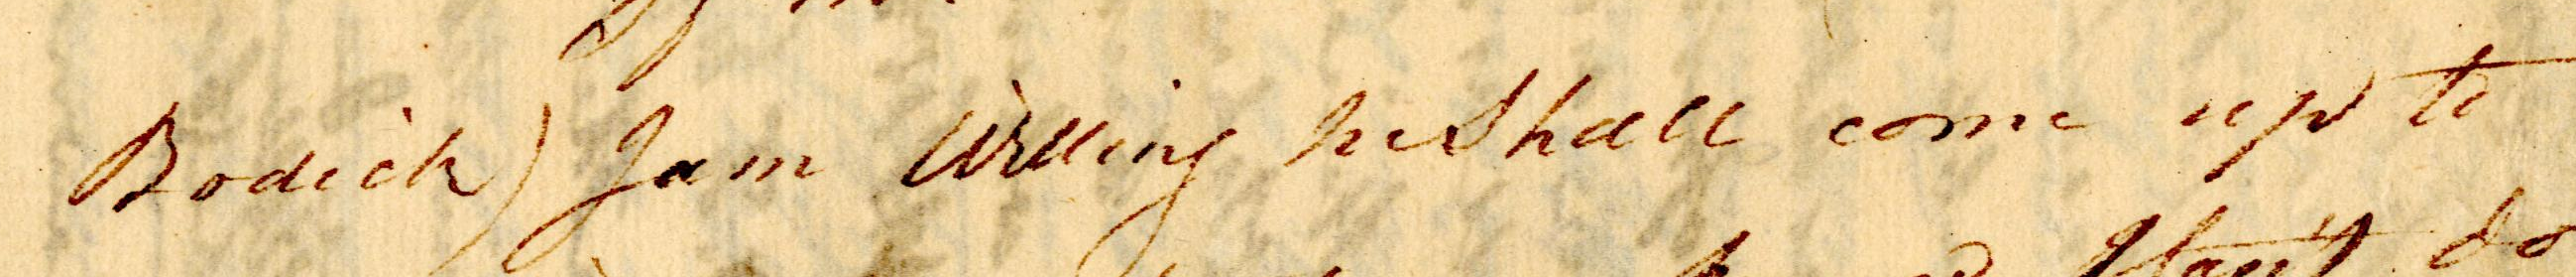Bodick) I am willing he shall come up to
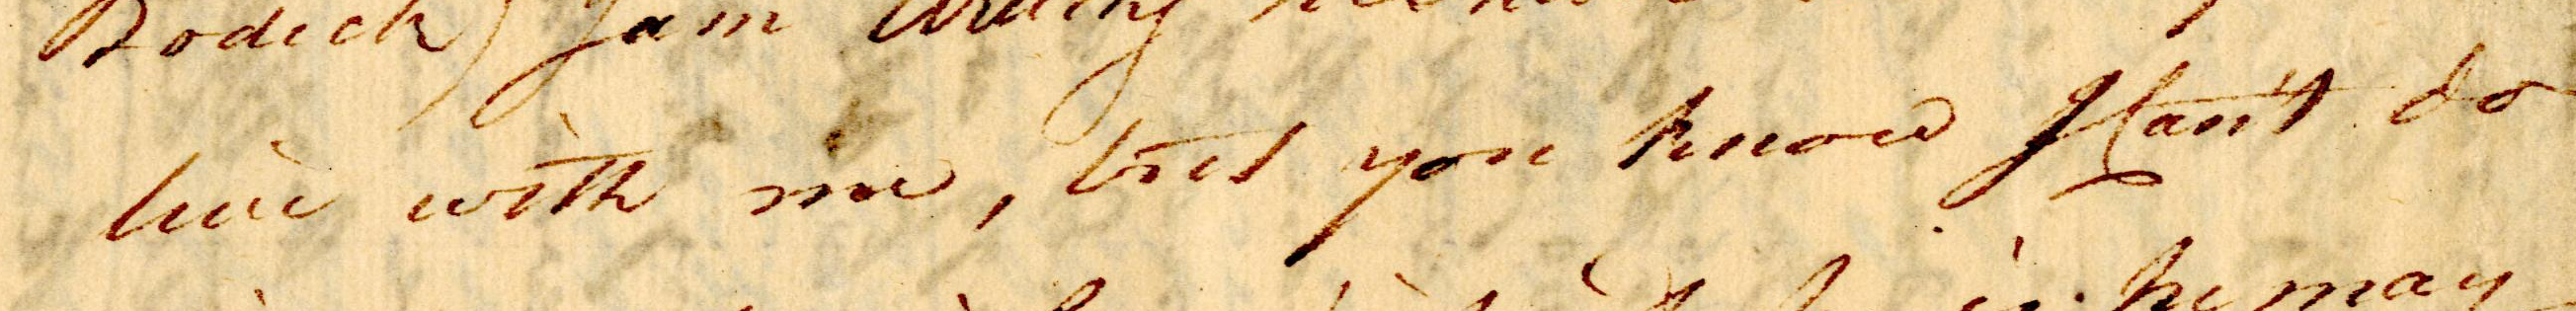live with me, best you know I can't do
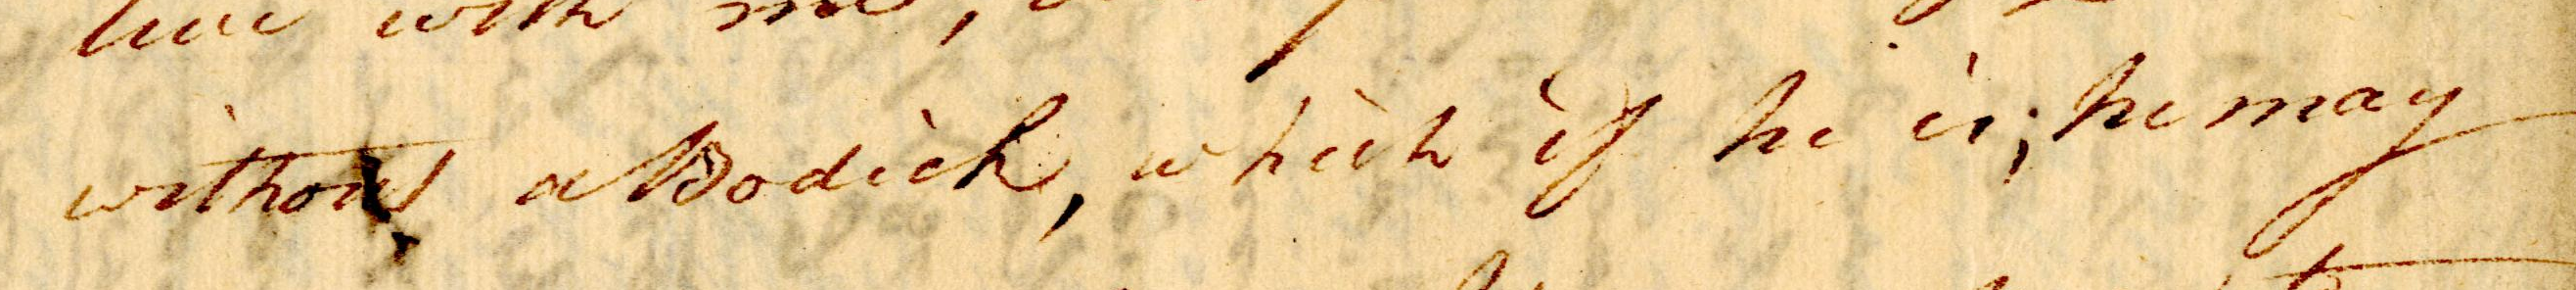without a Bodick, which if he is, he may
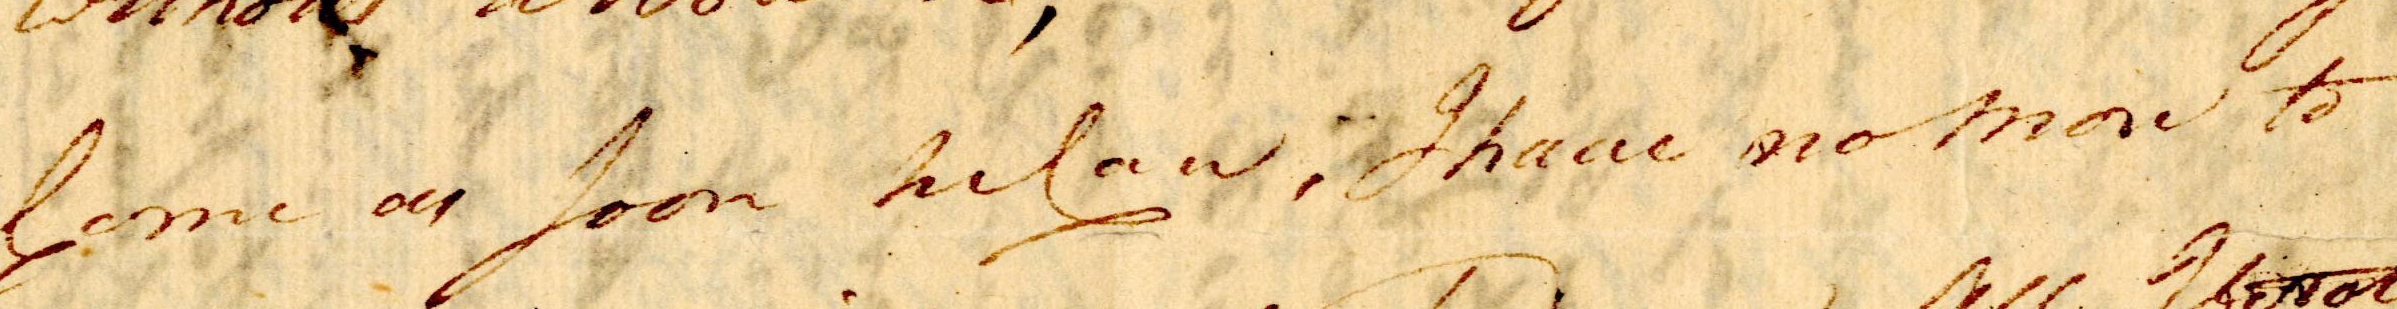Come as soon he Can, I have no more to
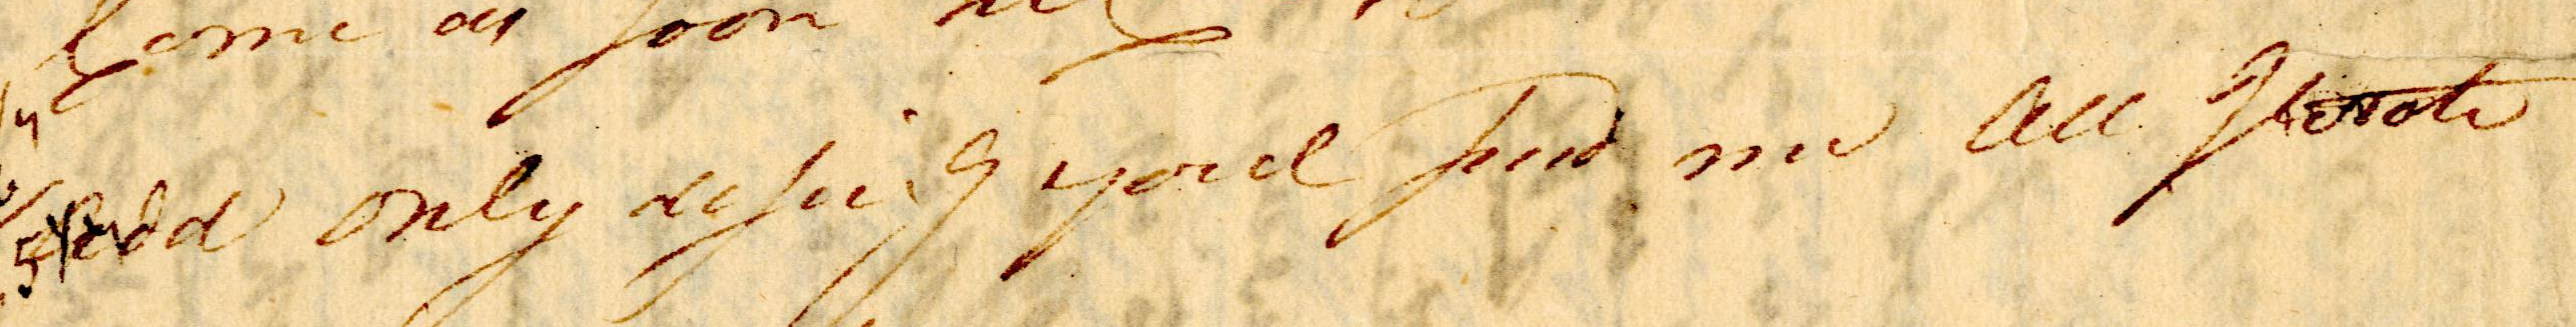add only desir^g youl send me All I wrote
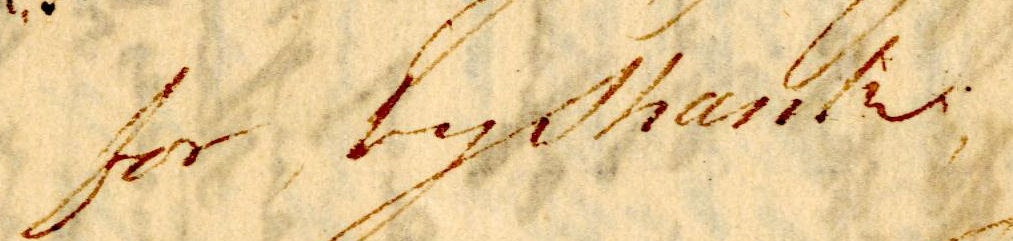for by Shank
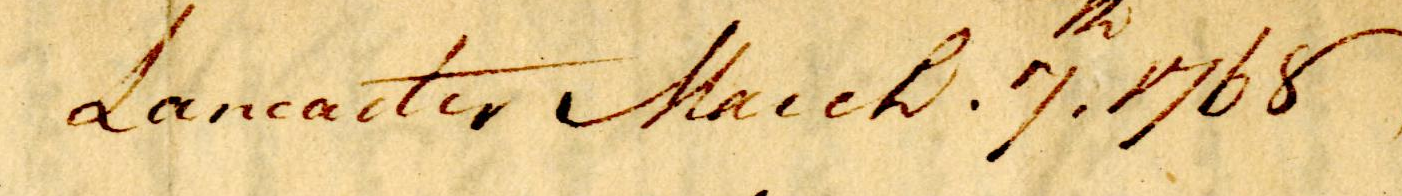Lancaster March. 7^th. 1768
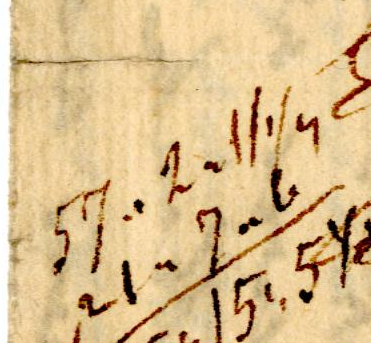57..2.11 1-/4
